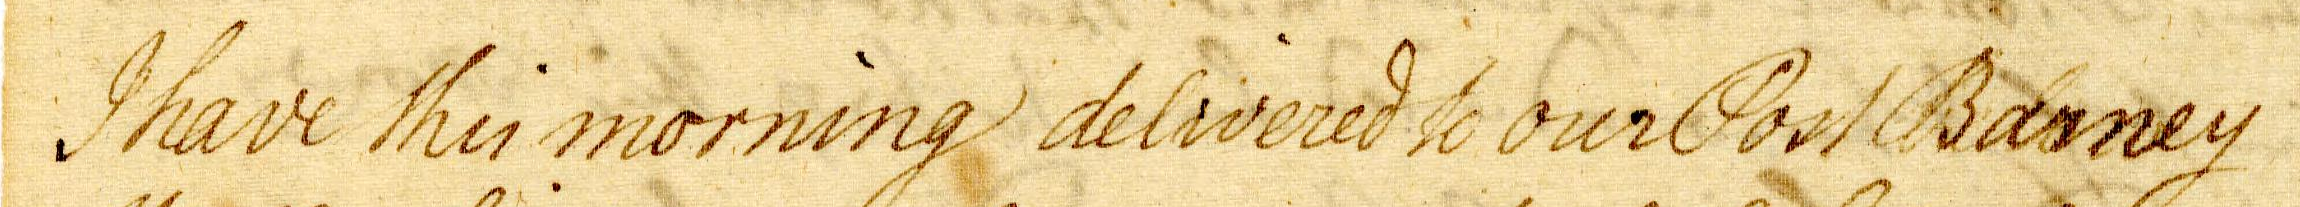I have this morning delivered to our Post Barney
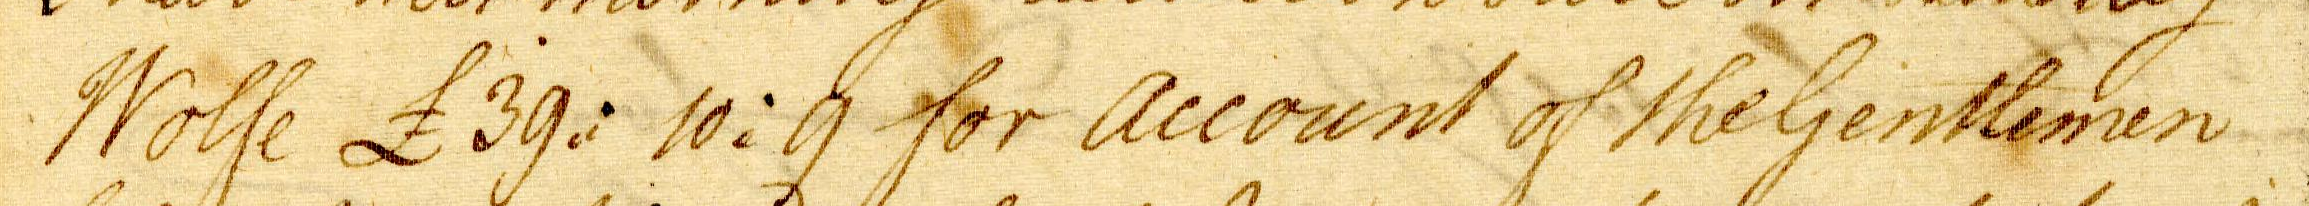Wolfe £39..10:9 for Account of the Gentlemen
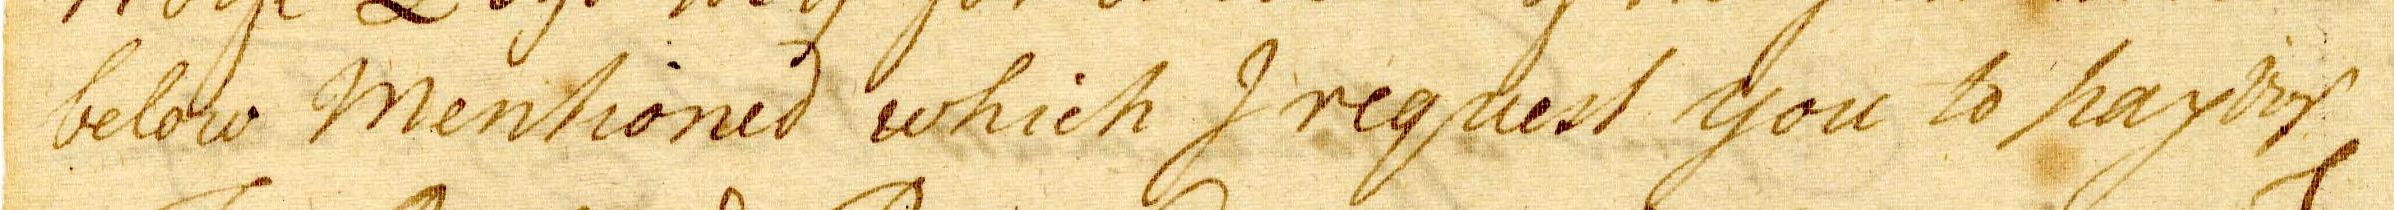below Mentioned which I request you to pay viz^t.
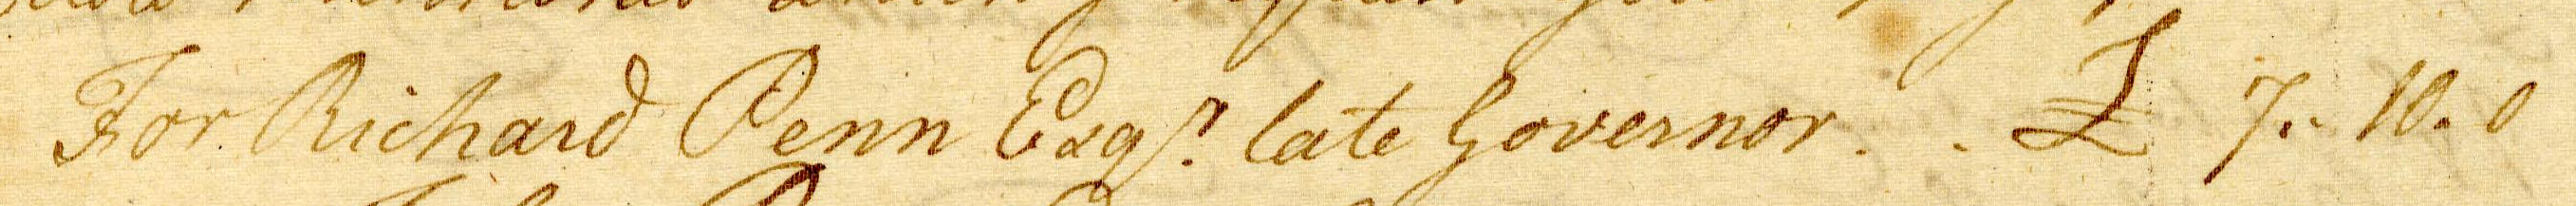For Richard Penn Esq^r. late Governor.. £7..10.0
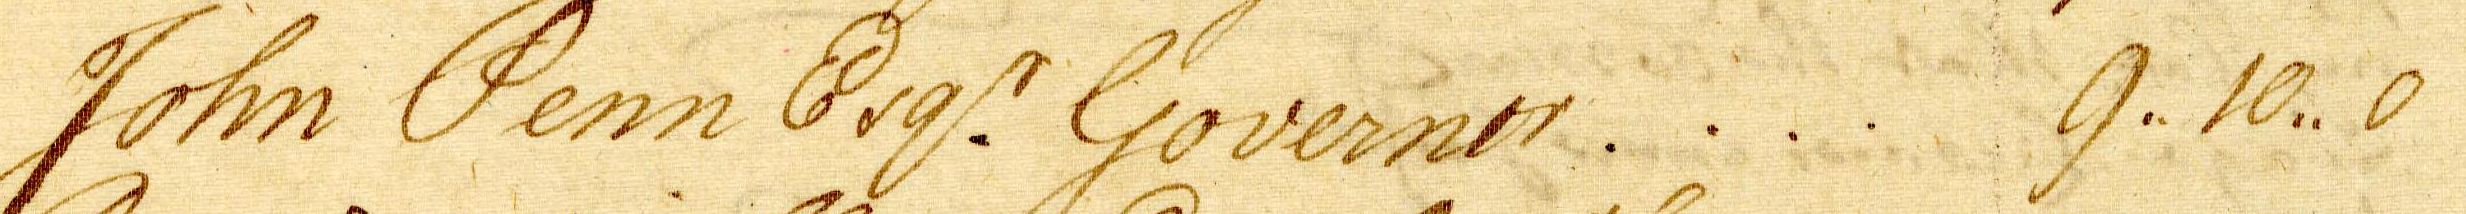John Penn Esq.^r Governor.... 9.10..0
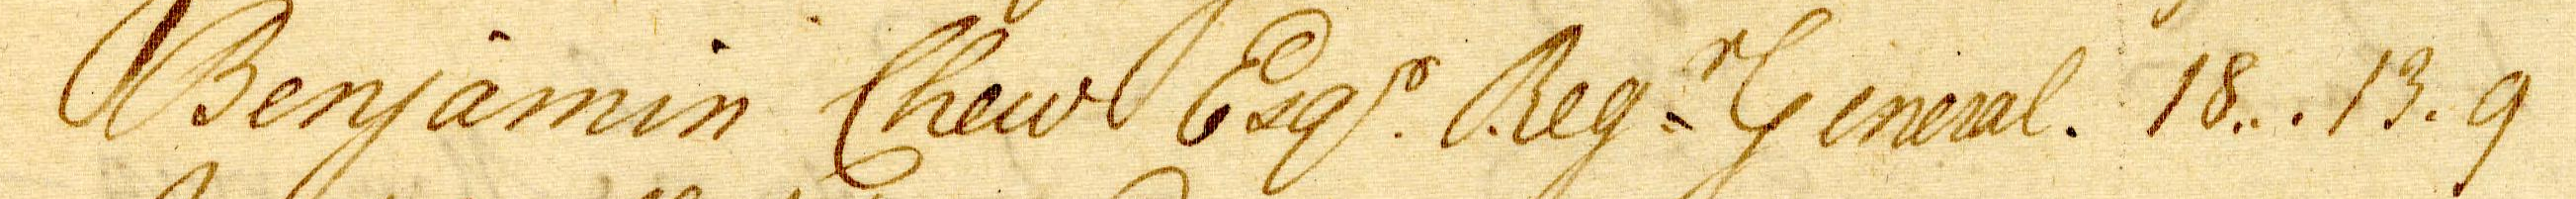Benjamin Chew Esq^r. Reg^r. General. 18..13.9
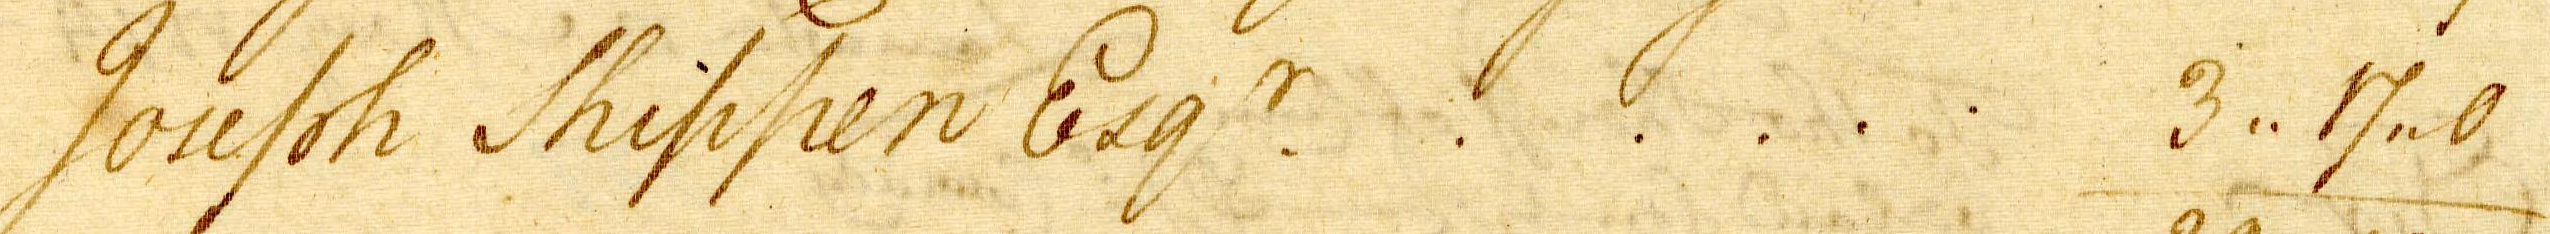Joseph Shippen Esq^r...... 3..17..0
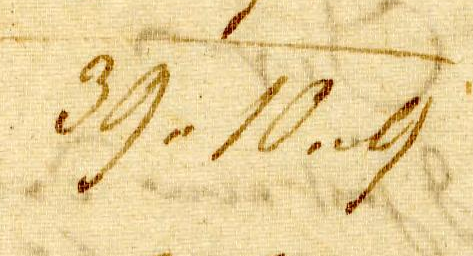39..10..9
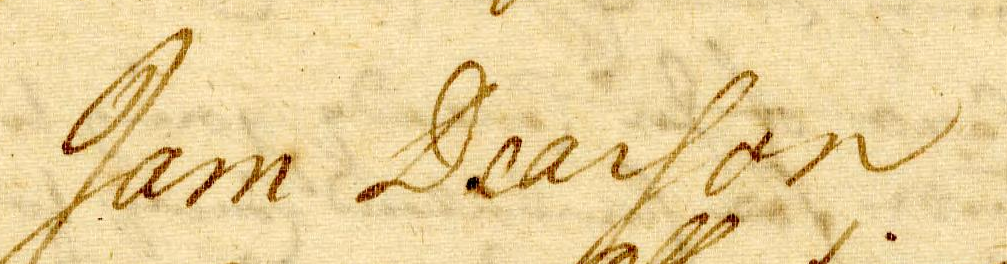I am Dear Son
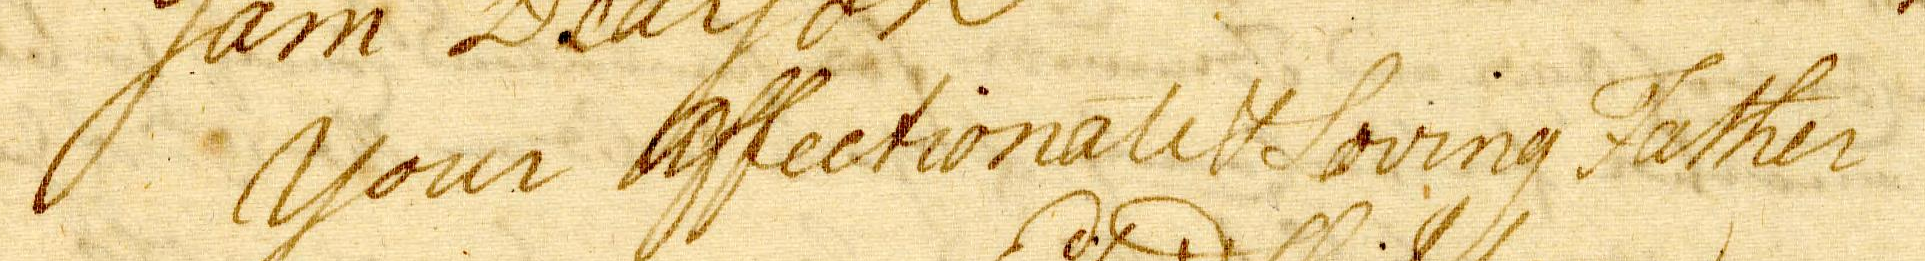Your Affectionate & Loving Father
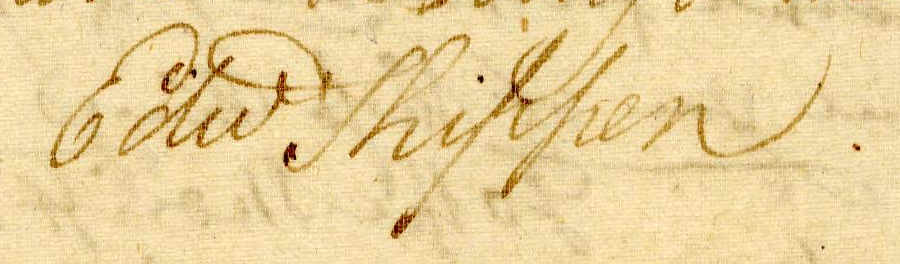Edw Shippen
